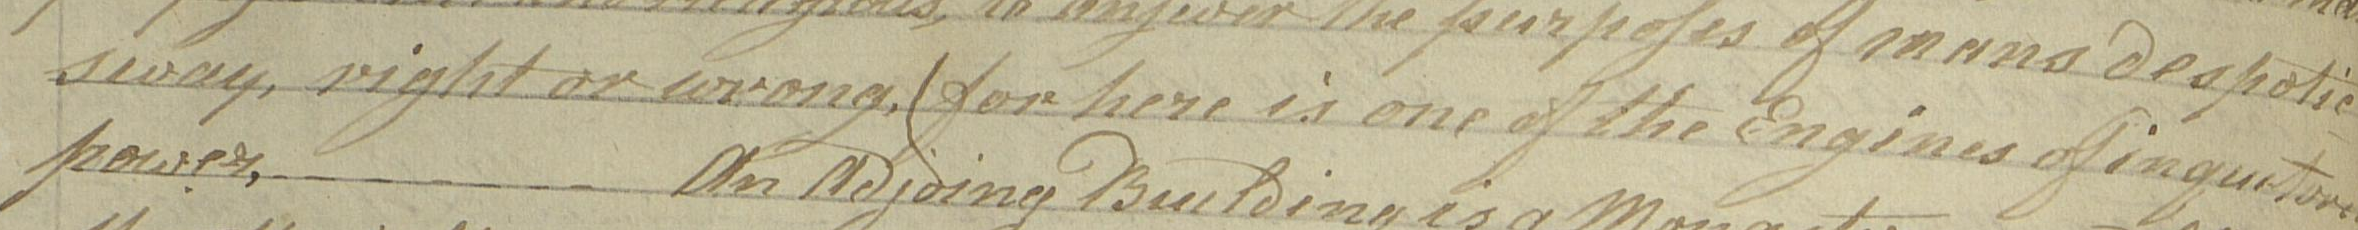sway, right or wrong (for here is one of the Engines of inquitorial
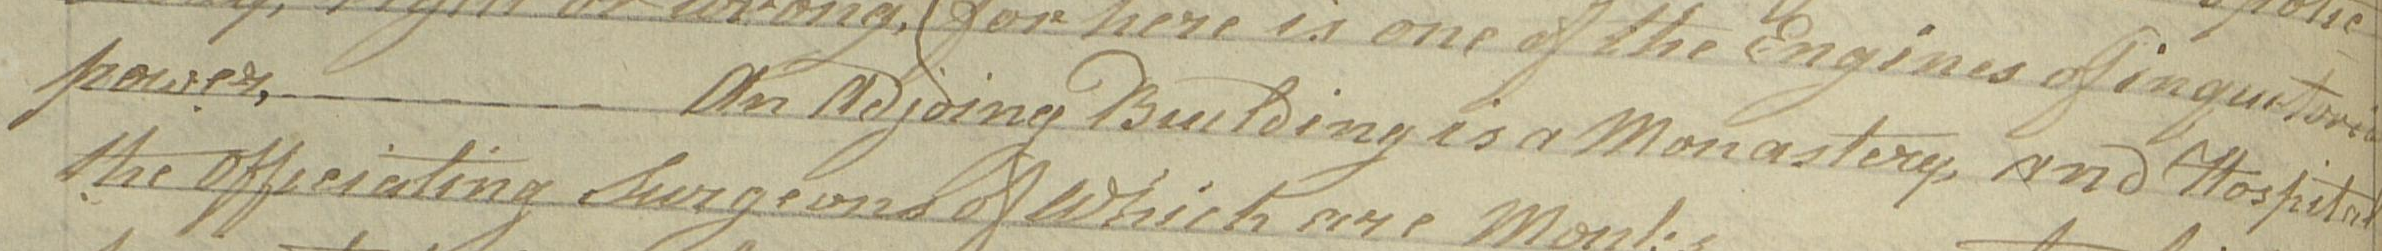power, An Adjoing Building is a Monastery and Hospital
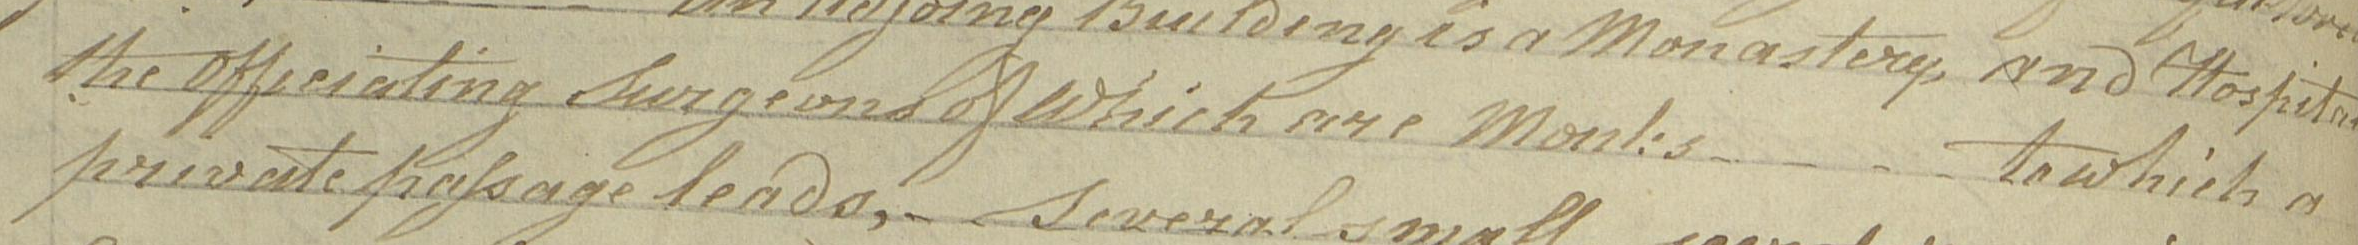the Officiating Surgeons of Which are Monks to which a
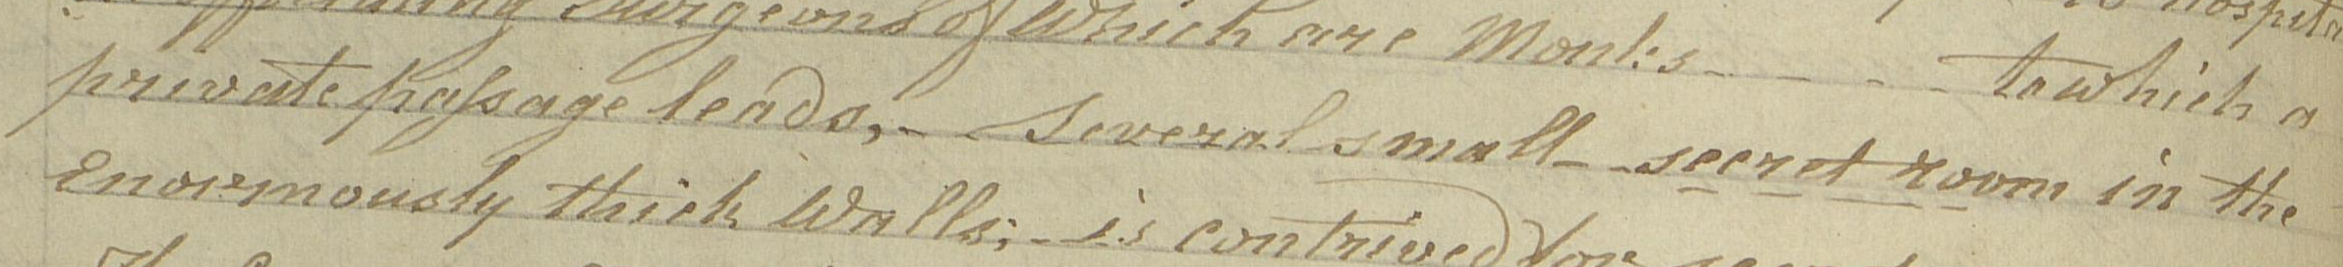private passage leads, Several small, secret room in the
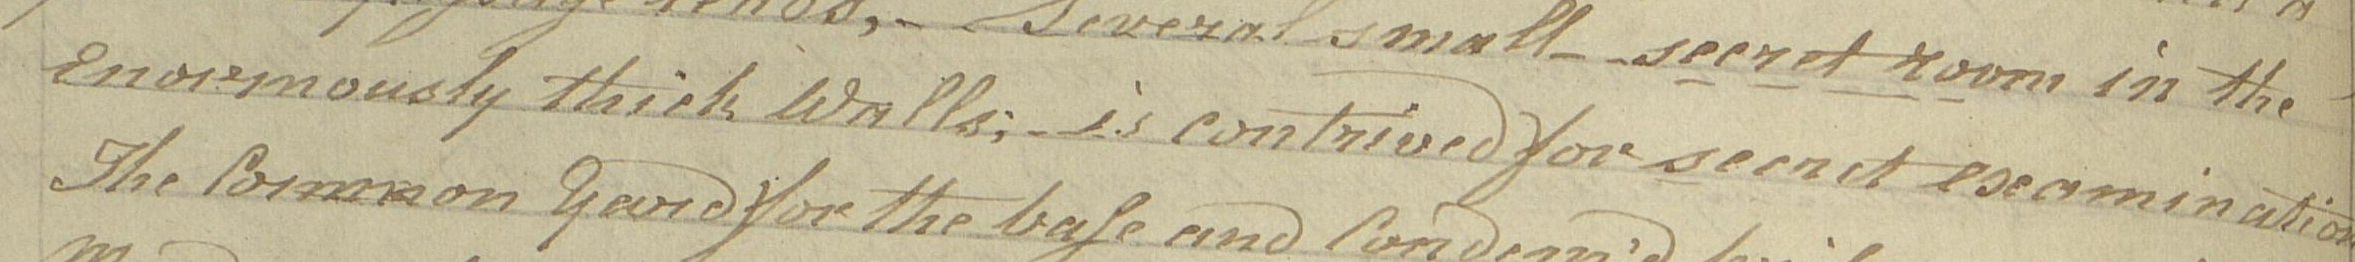enormously thick Walls; is contrived for secret examination
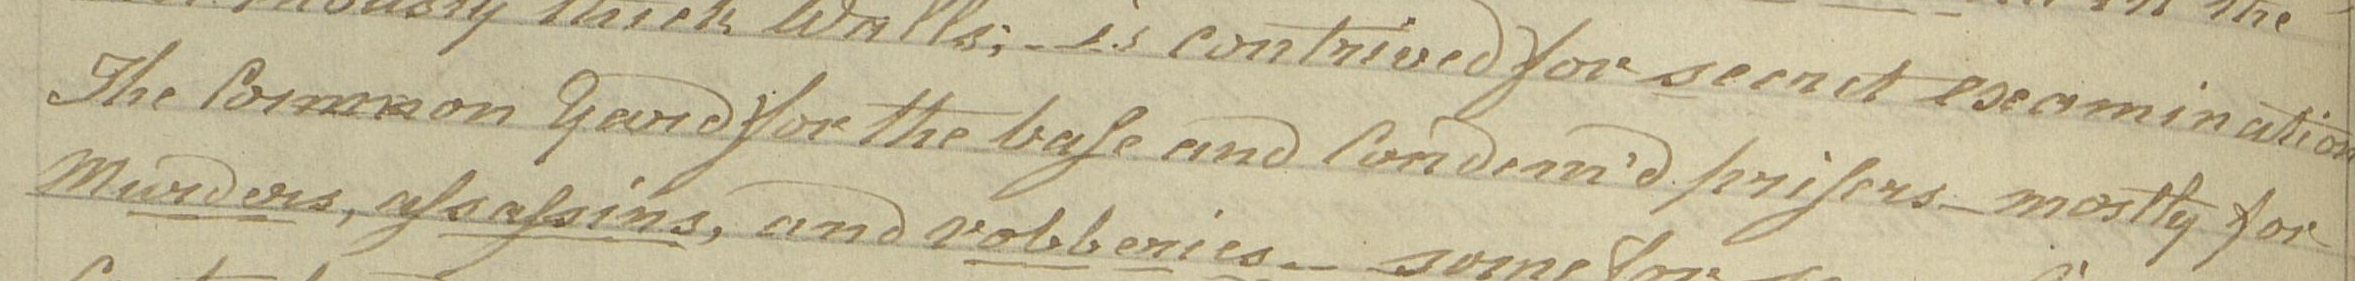The Common Yard for the base and Condem'd prisers, mostly for
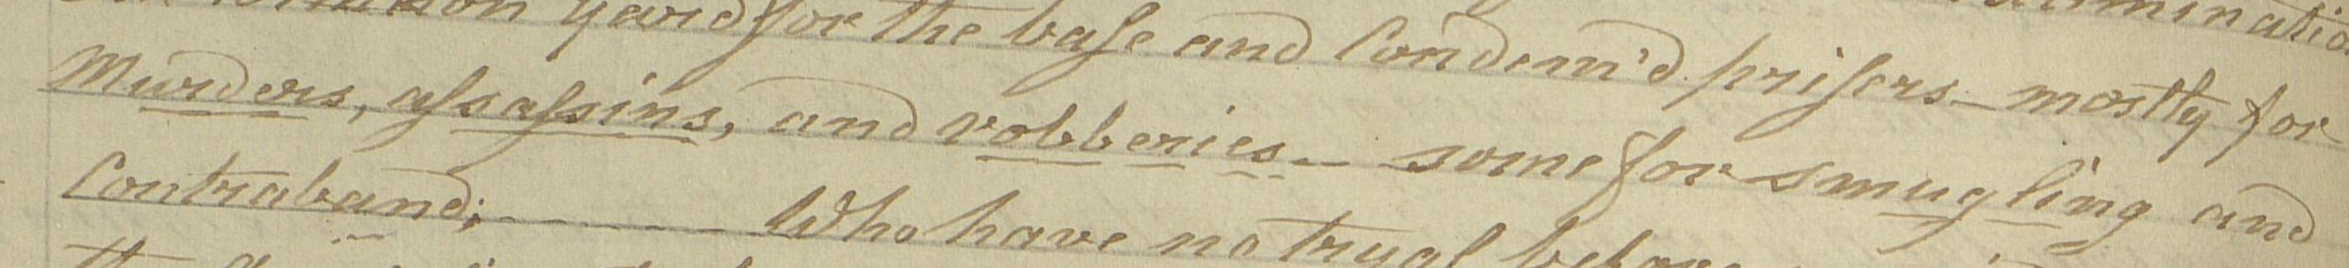Murders, assassins, and robberies. some for smugling and
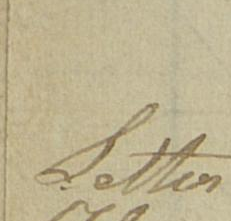Letter
